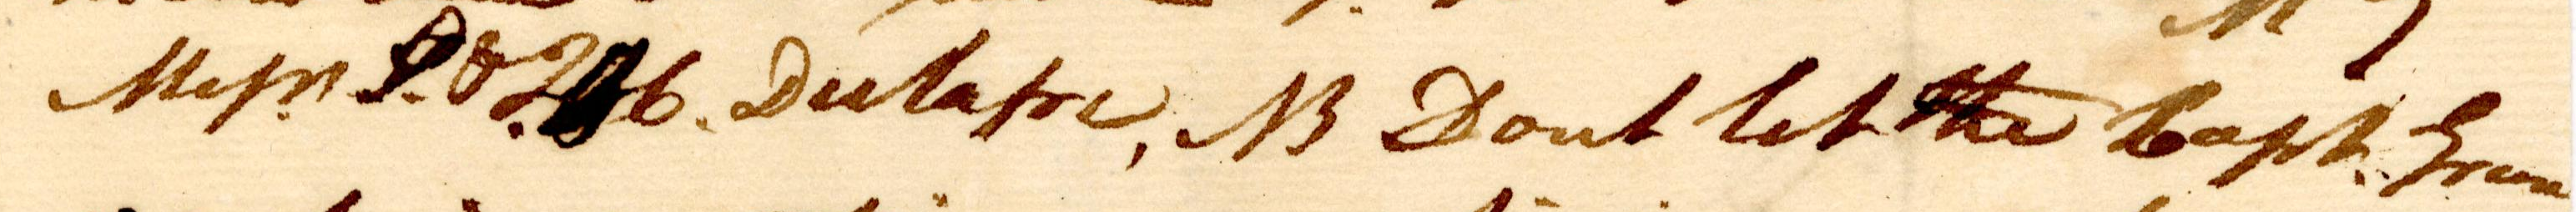Mess^rs P & 206 Dulasse, NB Dont let the Capt^n Green
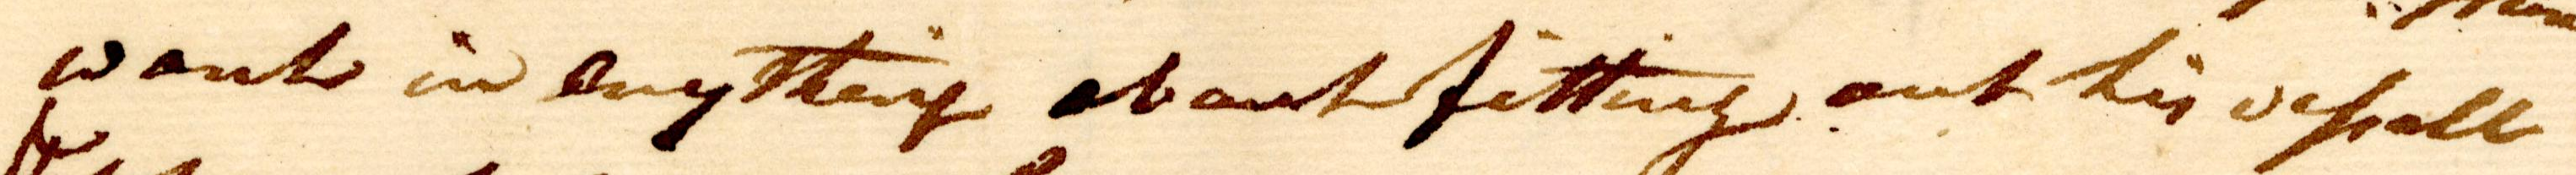want in anything about fitting out his vessall
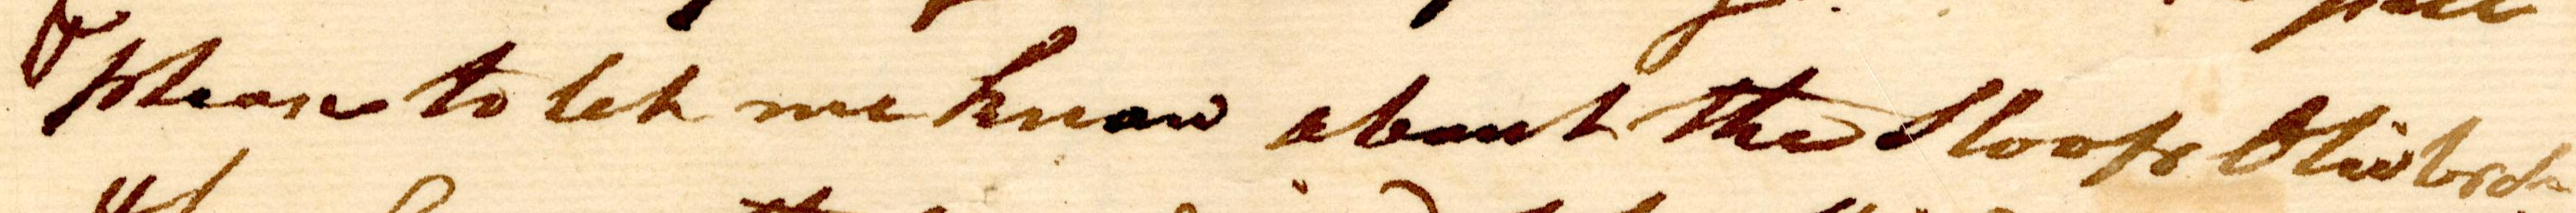& please to let me know about the Sloops Olivbrot
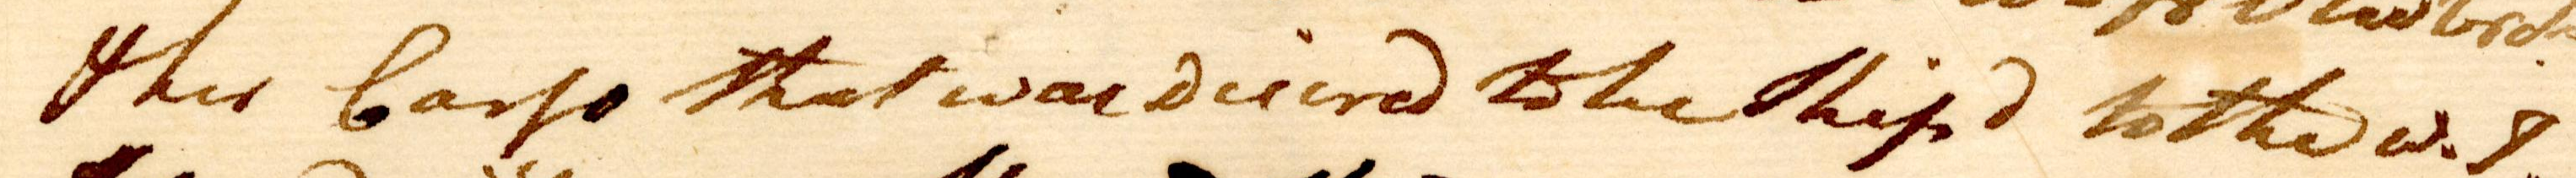& her Cargo that was desired to be Ship'd to the W. I.
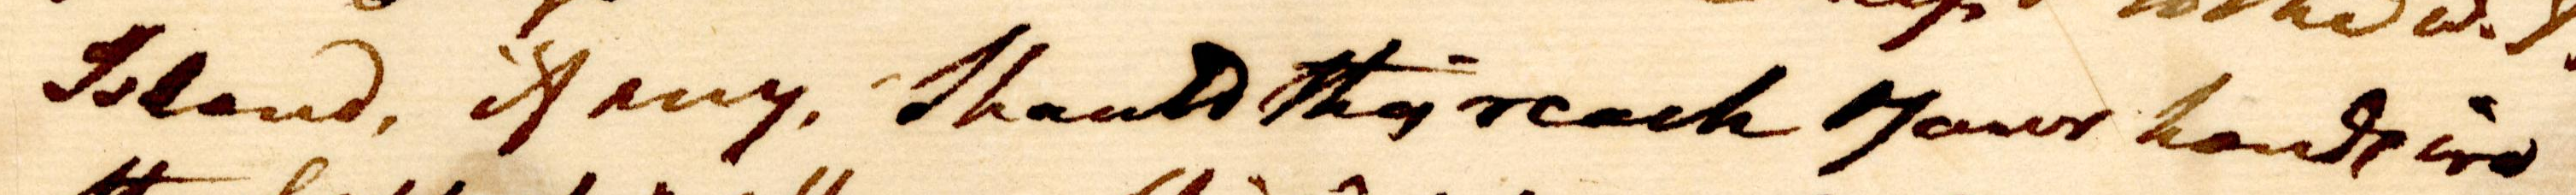Island, if any. Should this reach your hands in
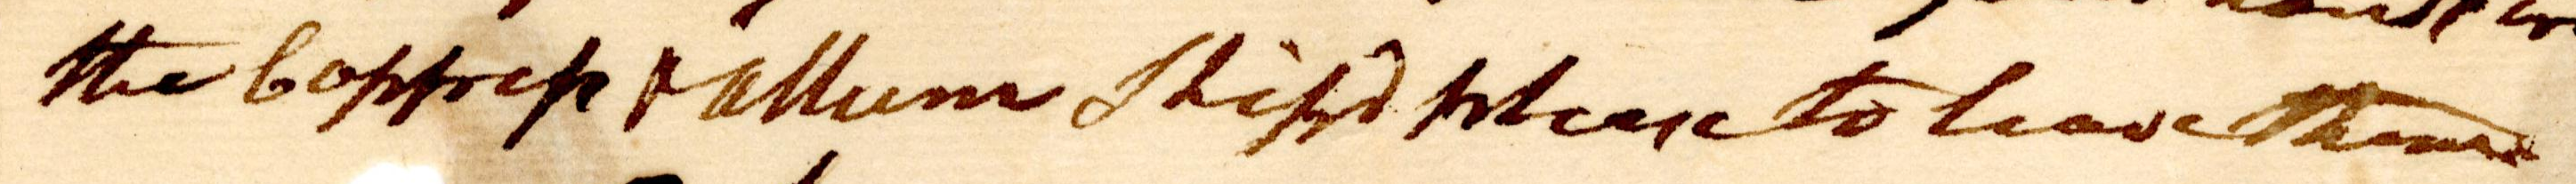the Coppers & allum Ship'd please to leave them
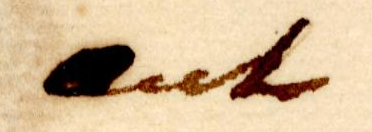out
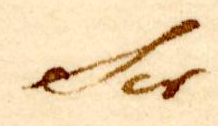Sir
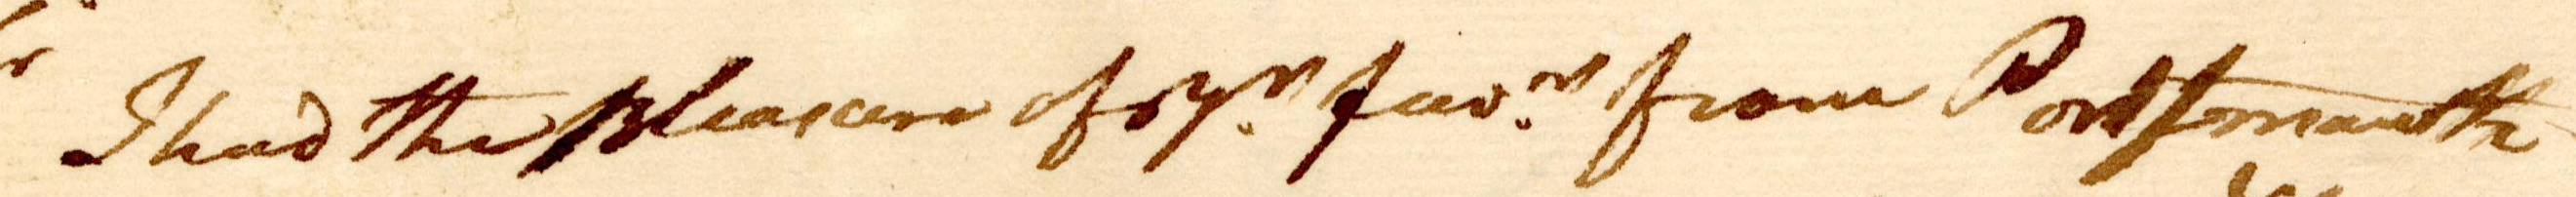I had the pleasure of y^r fav^rs from Portsmouth
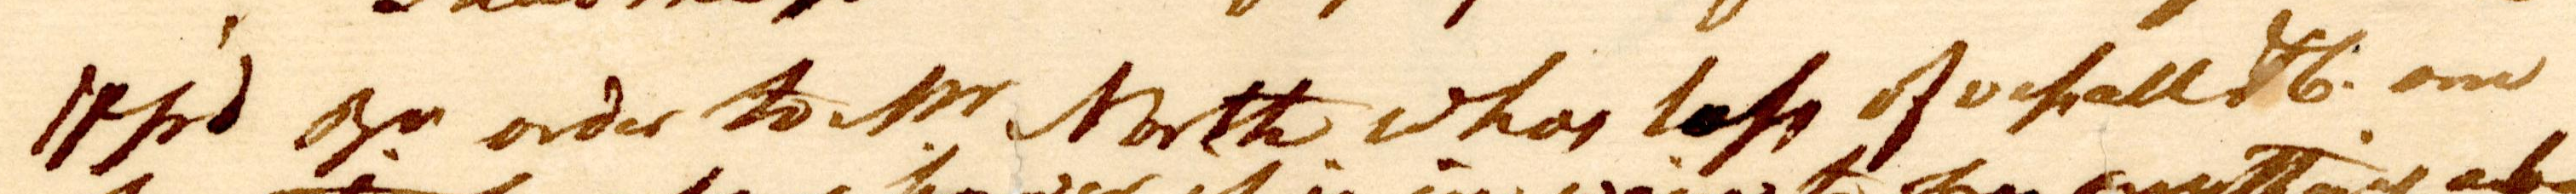shp'd y^r order to M^r. North whos loss of vessall &C. am
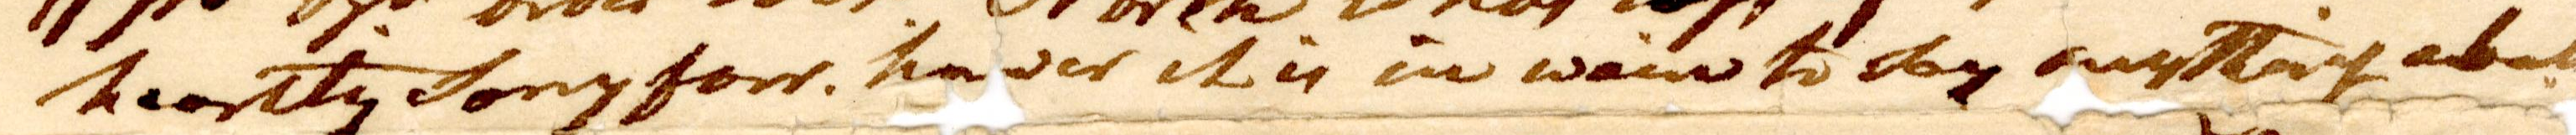hearty Sorry for him was it is in wain to say anything about
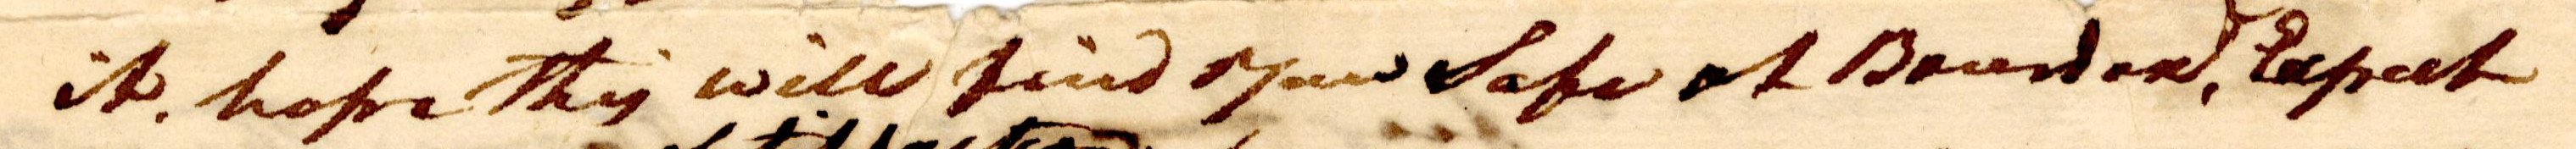it, hope this will find you Safe at Bauded, Expect
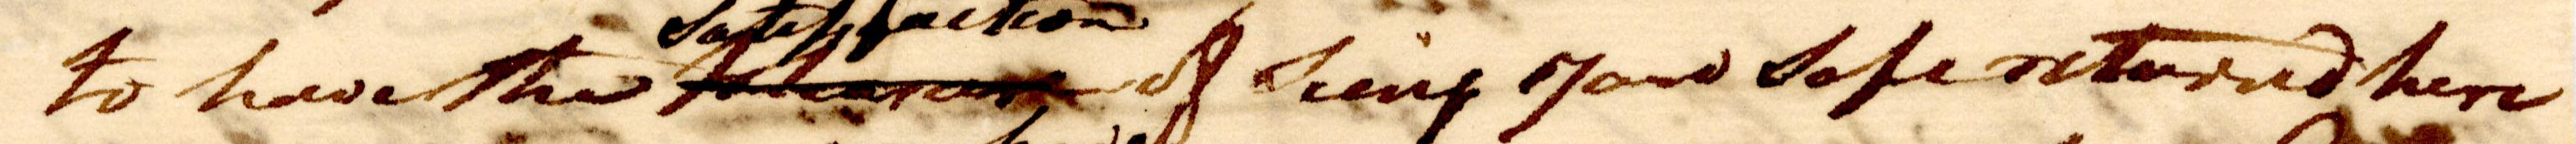to have the [______] of seeing your safe returned here
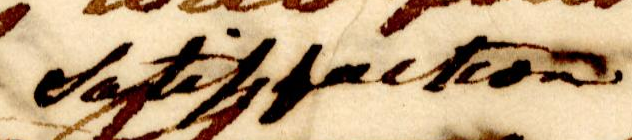satisfaction
